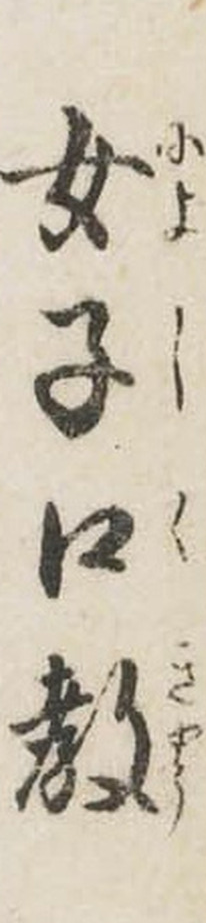女子口教
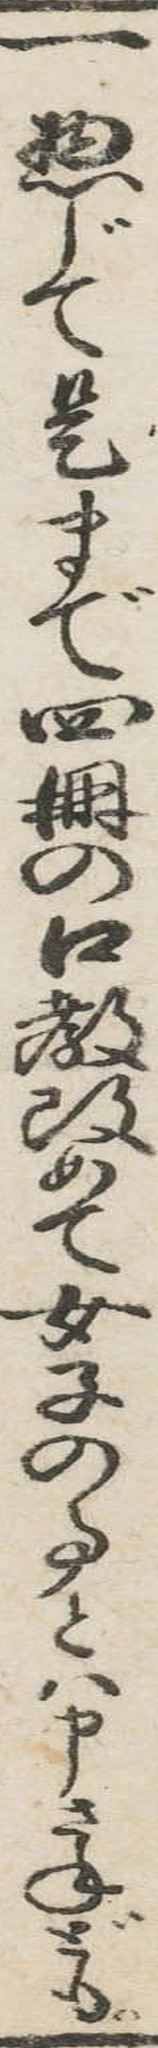一惣じて是まで四冊の口教改めて女子の事とは申さねども
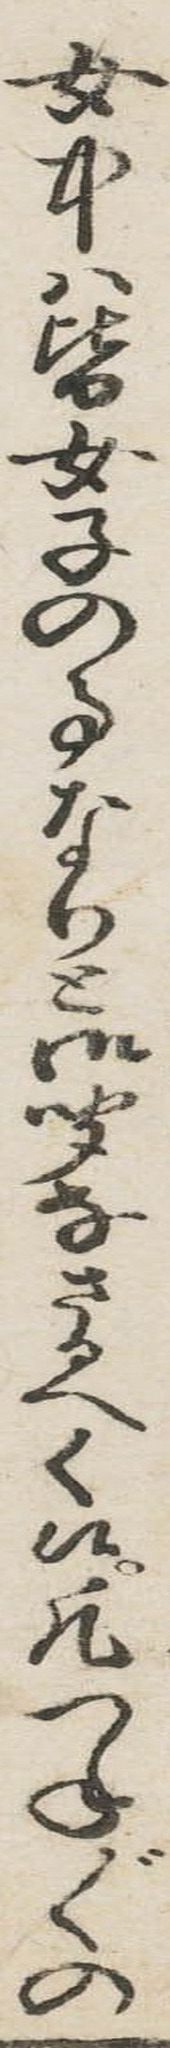女中は皆女子の事なりと御聞なさるへく候。凡つね〴〵の
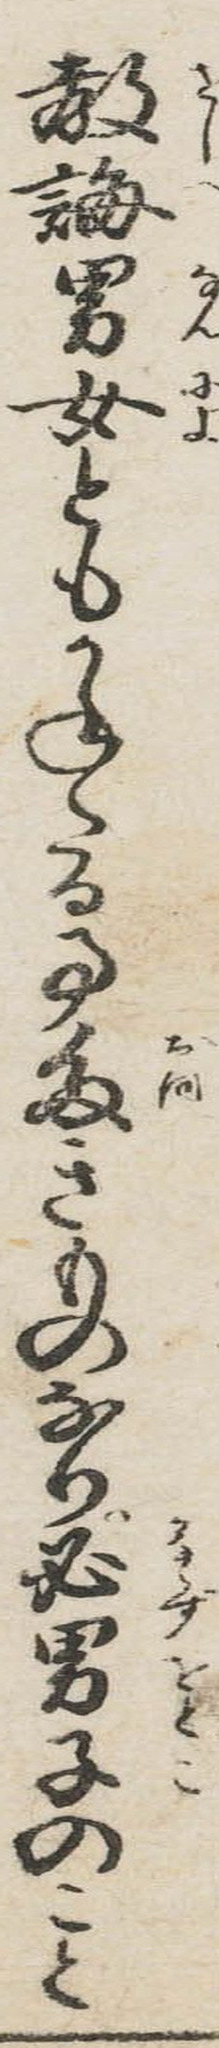教論男女ともかねたること事多きもなり必男子のこと
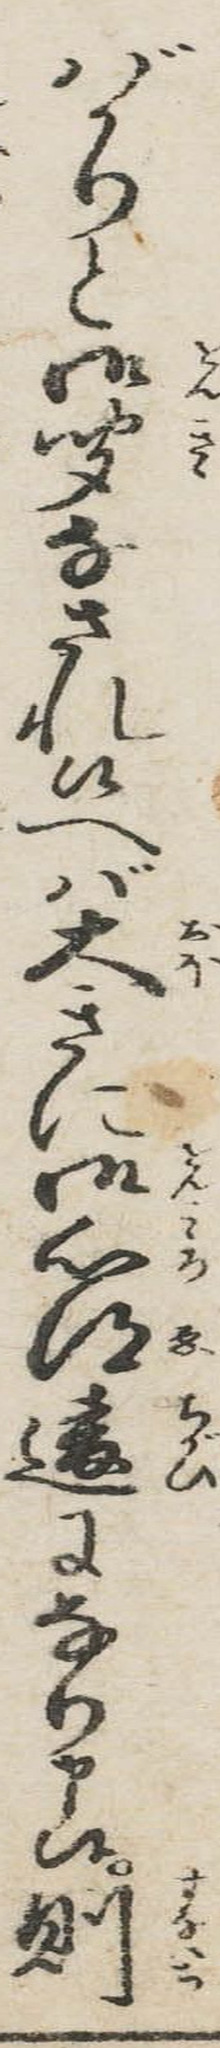ばかりと御聞なされ候へば大きに御心得違になり申候。則
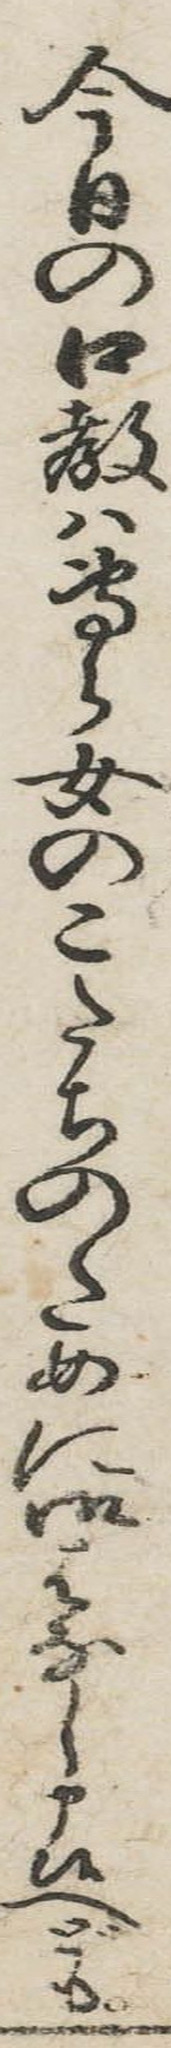今日の口教は専ら女のこたちのために御はなし申候へども。
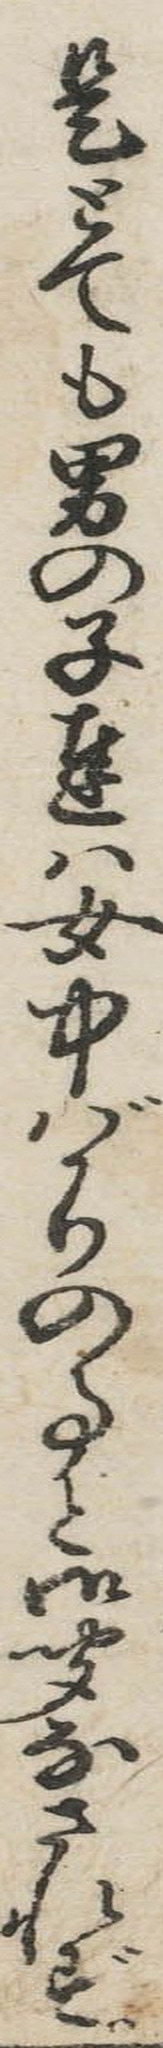是とても男の子達は女中ばかりの事と御聞なされず
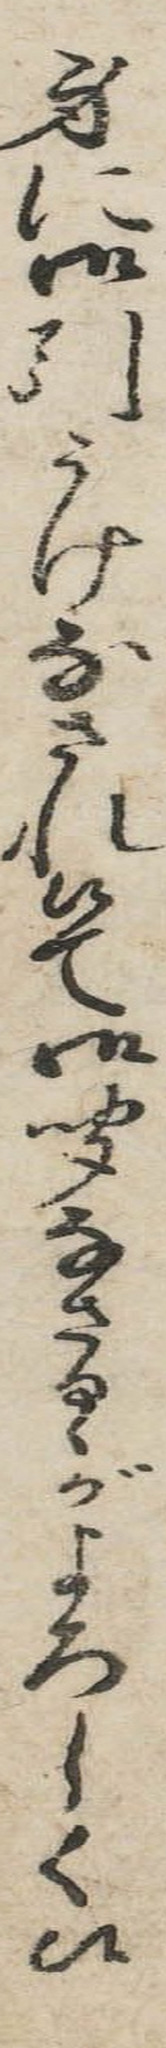身に御引うけなされ候て御聞なさるゝがよろしく候
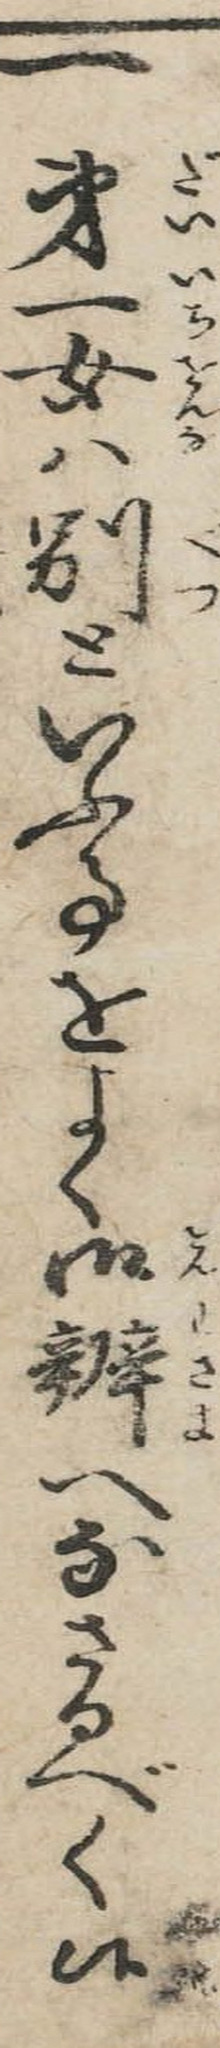一第一女は別といふ事をよく御弁へなさるべく候

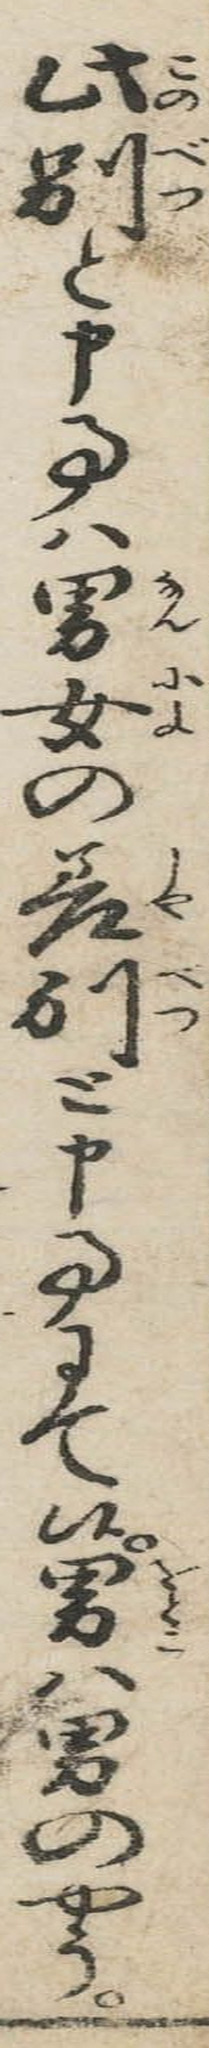此別と申事は男女の差別と申事にて候。男は男のやう。
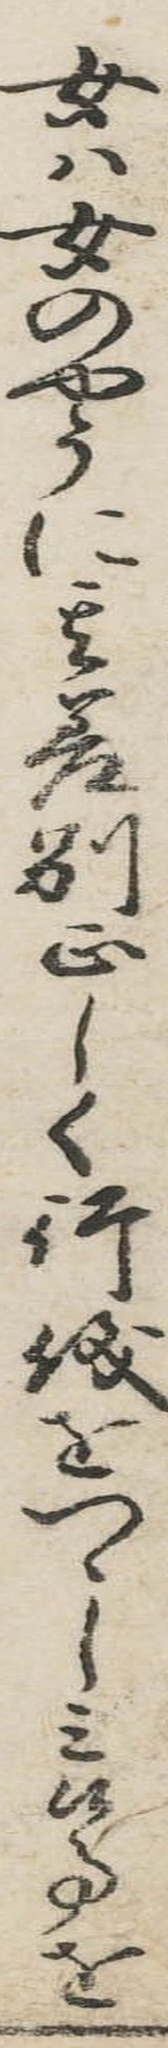女は女のやうに其差別正しく行儀をつゝしみ候事を
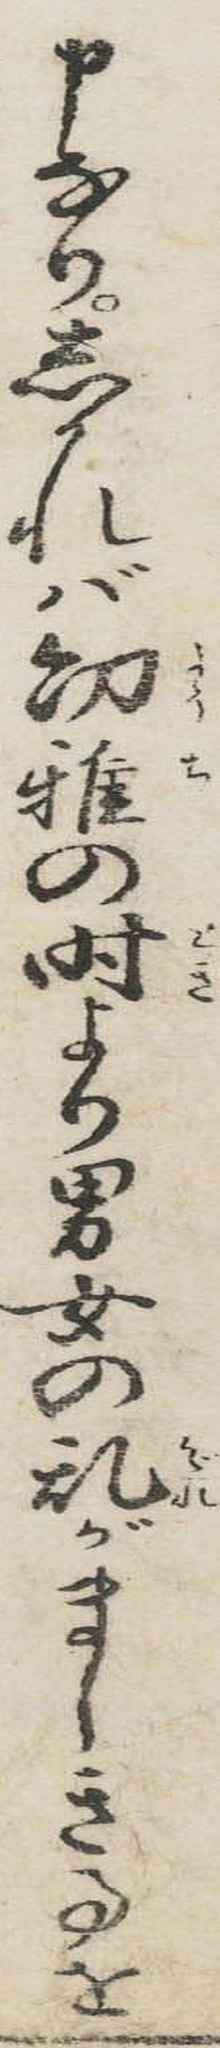申なり。しかれば幼稚の時より男女の乱がましき事を
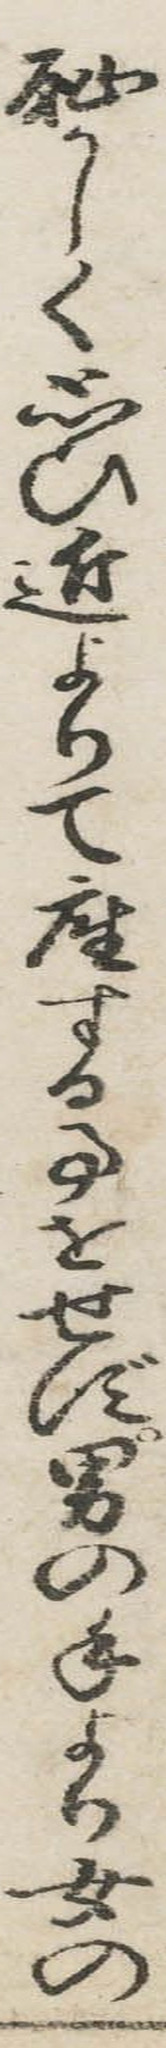恥かしく思ひ近よりて座する事をせず。男の手より女の
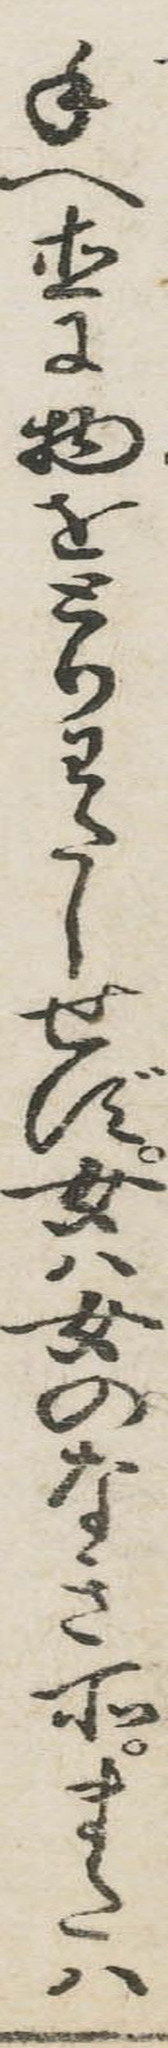手へ直に物をとりわたしせず。女は女のなき所。または
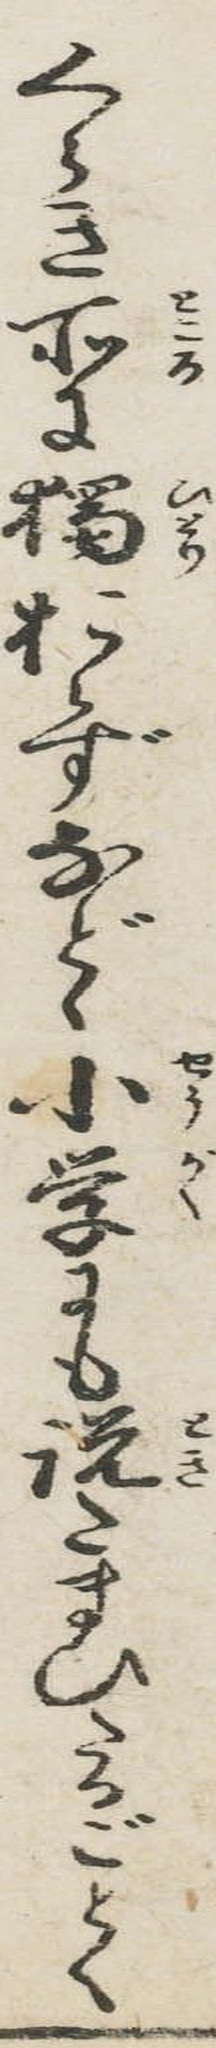くらき所に独たゝずなどゝ小学にも説たまひたるごとく
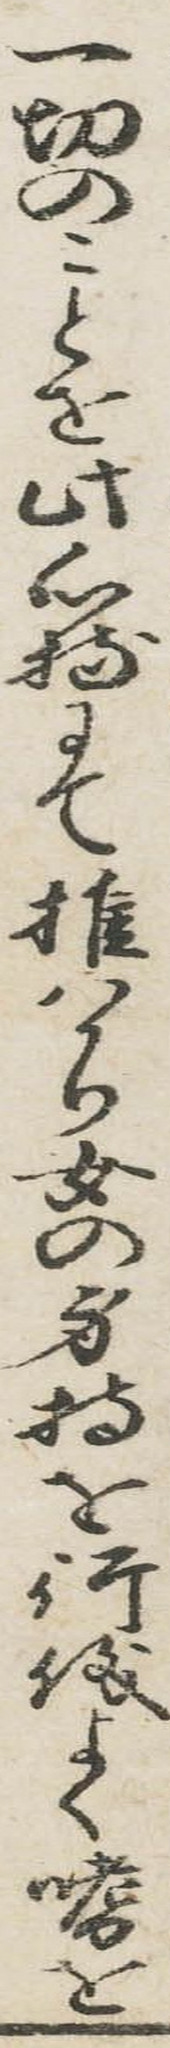一切のことを此心持にて推はかり女の身持を行儀よく嗜を
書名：前訓
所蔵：東京学芸大学附属図書館
